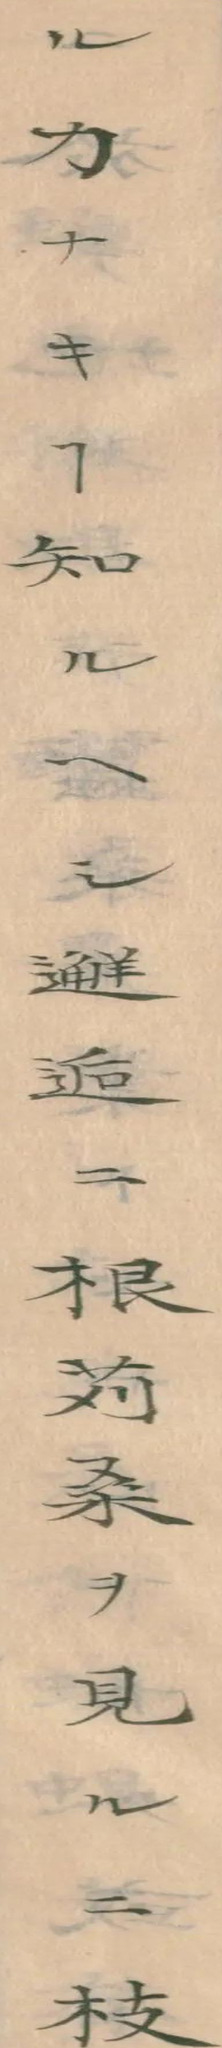ル力ナキコト知ルヘシ邂逅ニ根苅桑ヲ見ルニ枝
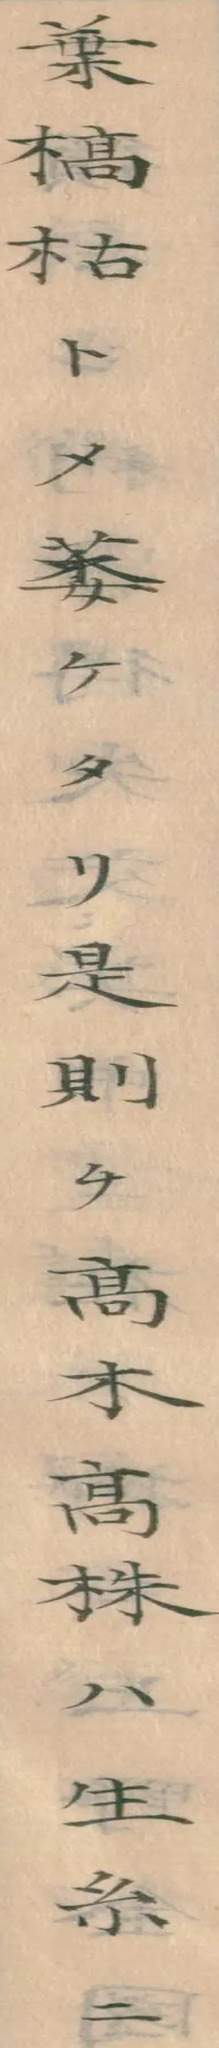葉槁枯トシテ萎ケタリ是則チ高木高株ハ生糸ニ
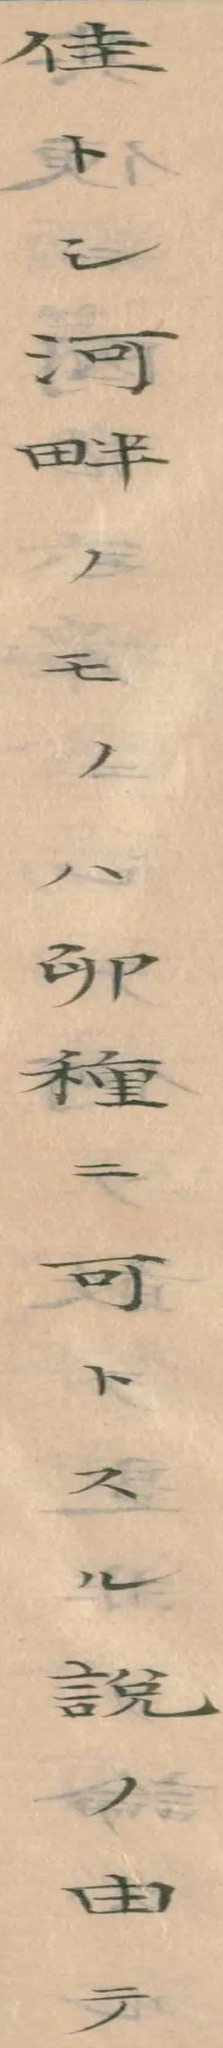佳トシ河畔ノモノハ卵種ニ可トスル説ノ由テ
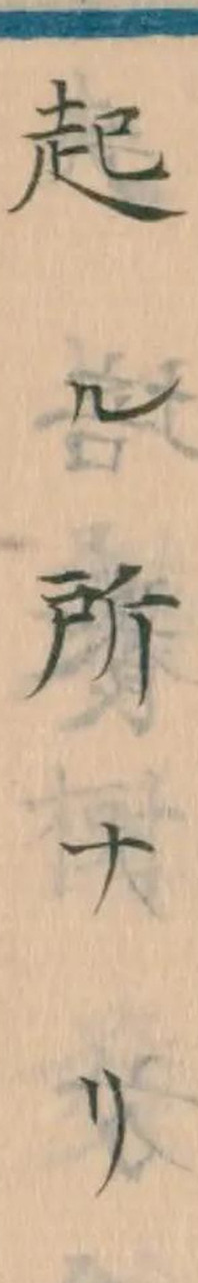起ル所ナリ
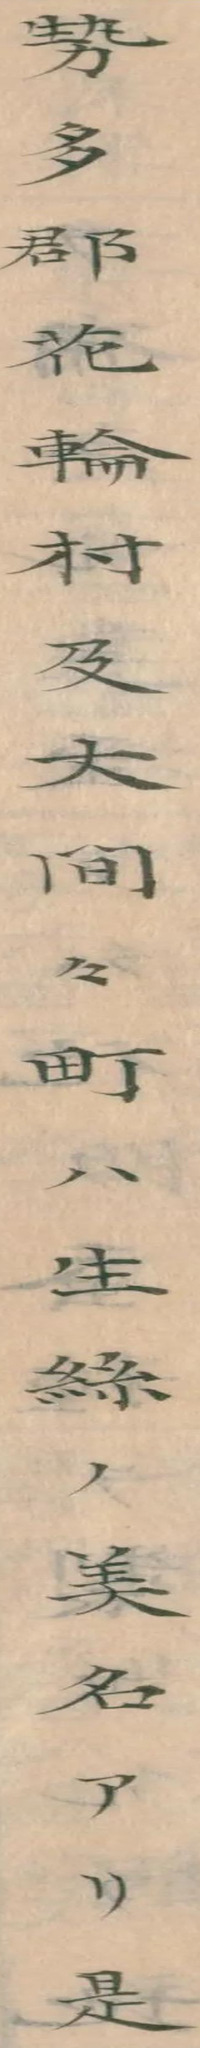勢多郡花輪村及大間々町ハ生糸ノ美名アリ是
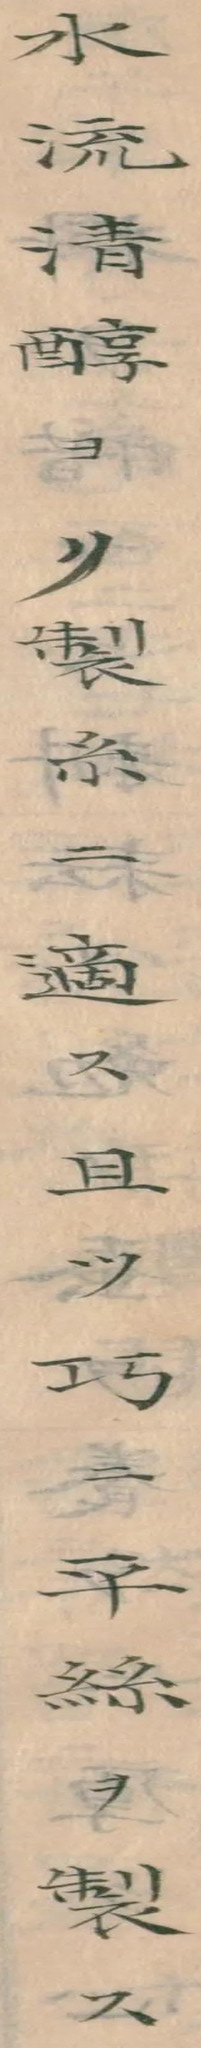水流清醇ヨリ製糸ニ適ス且ツ巧ニ平糸ヲ製ス
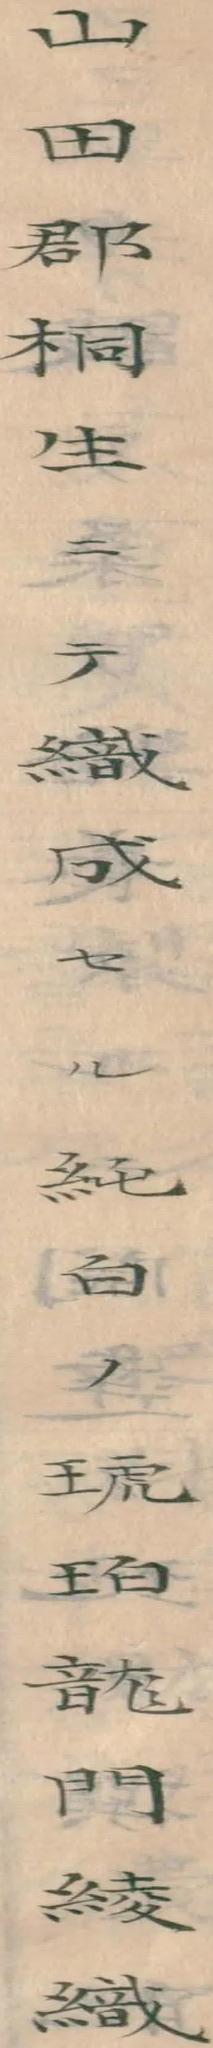山田郡桐生ニテ織成セル純白ノ琥珀龍門綾織
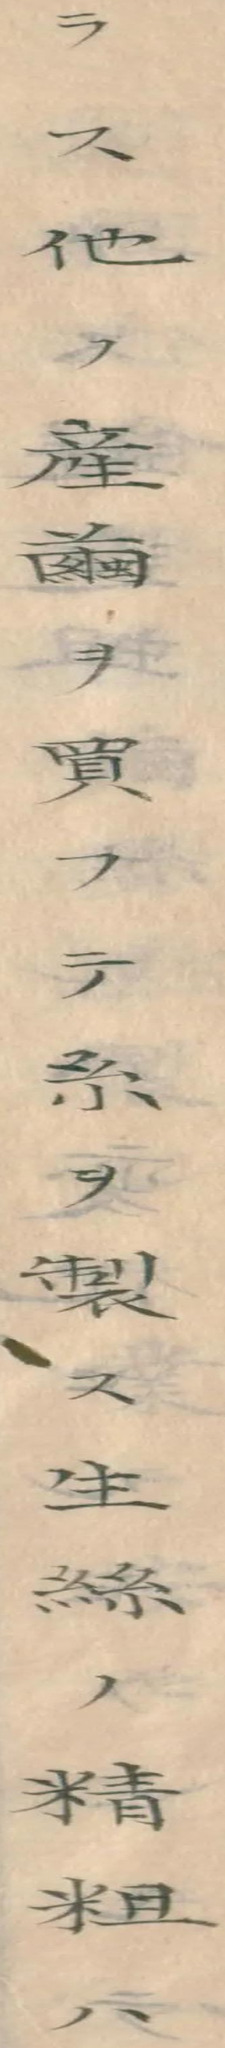ラス他ノ産繭ヲ買フテ糸ヲ製ス生糸ノ精粗ハ
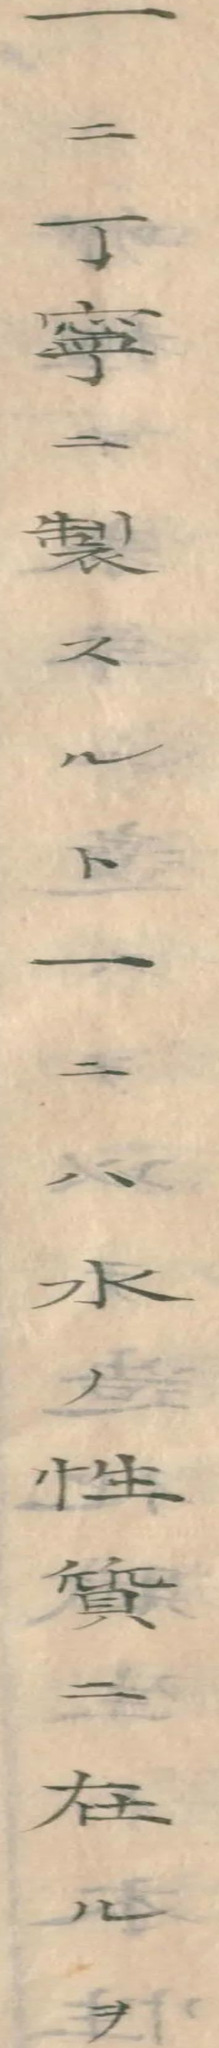一ニ丁寧ニ製スルト一ニハ水ノ性質ニ在ルヲ
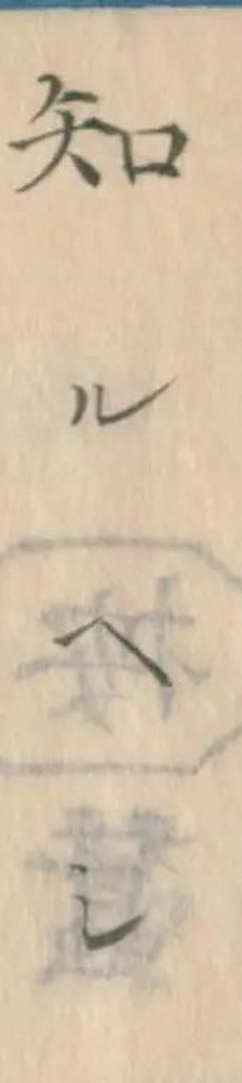知ルヘシ
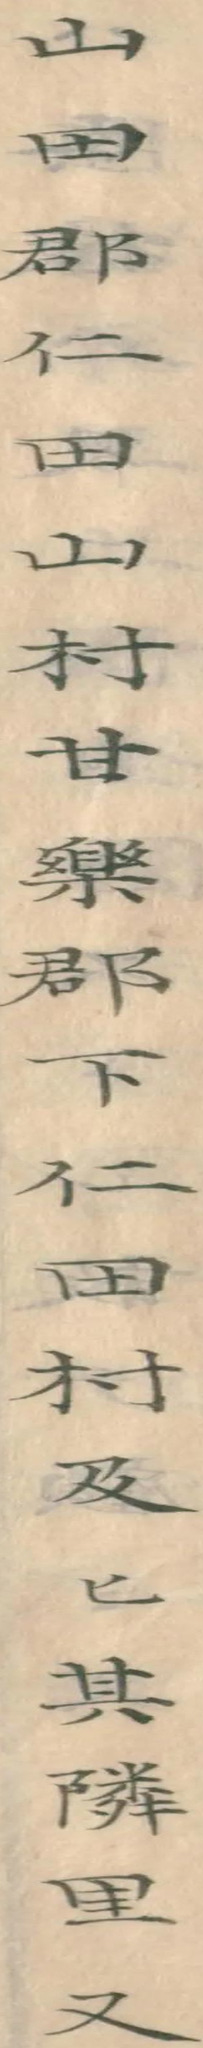山田郡仁田山村甘楽郡下仁田村及ヒ其隣里又
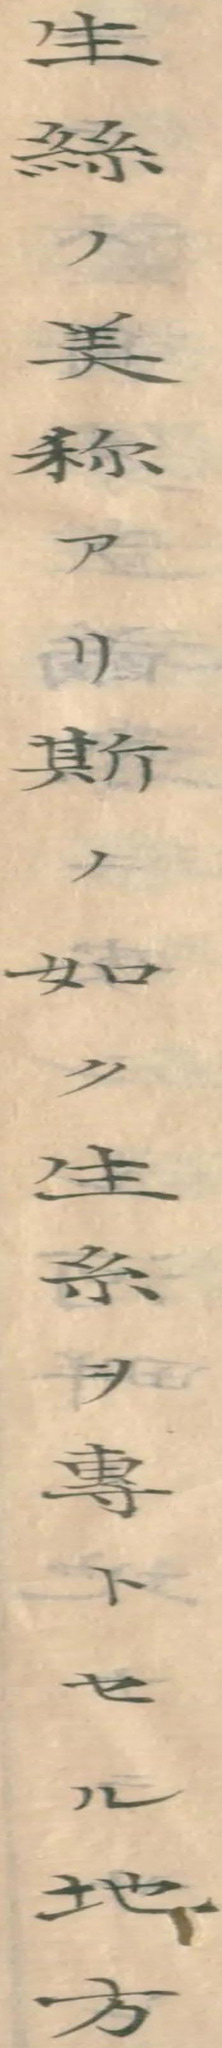生糸ノ美称アリ斯ノ如ク生糸ヲ専トセル地方

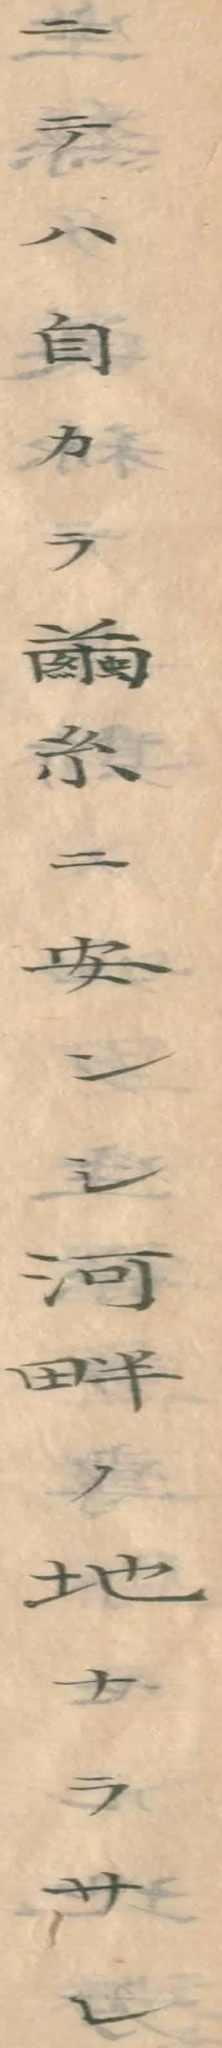ニテハ自カラ繭糸ニ安ンシ河畔ノ地ナラサレ
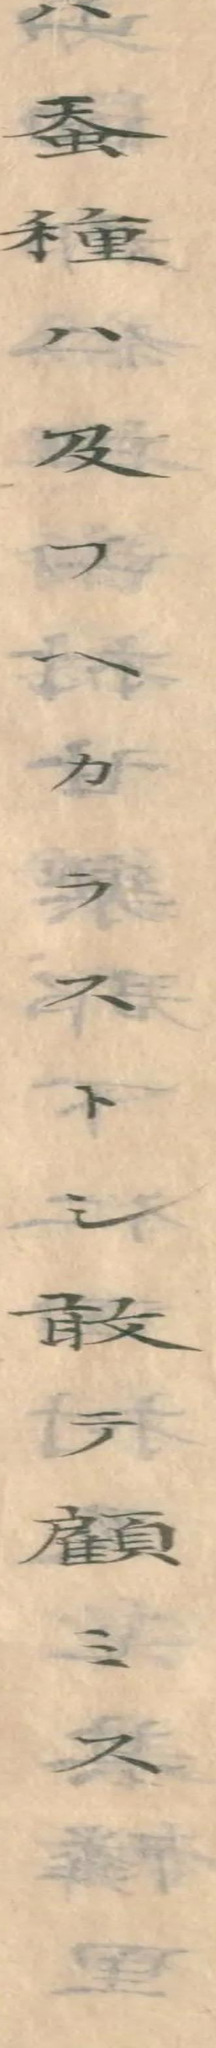ハ蚕種ハ及フヘカラストシ敢テ顧ミス
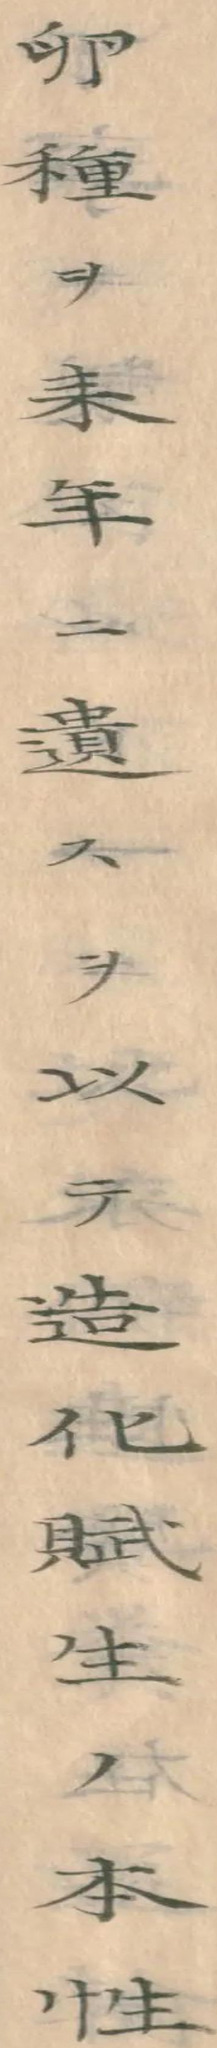卵種ヲ来年ニ遺スヲ以テ造化賦生ノ本性
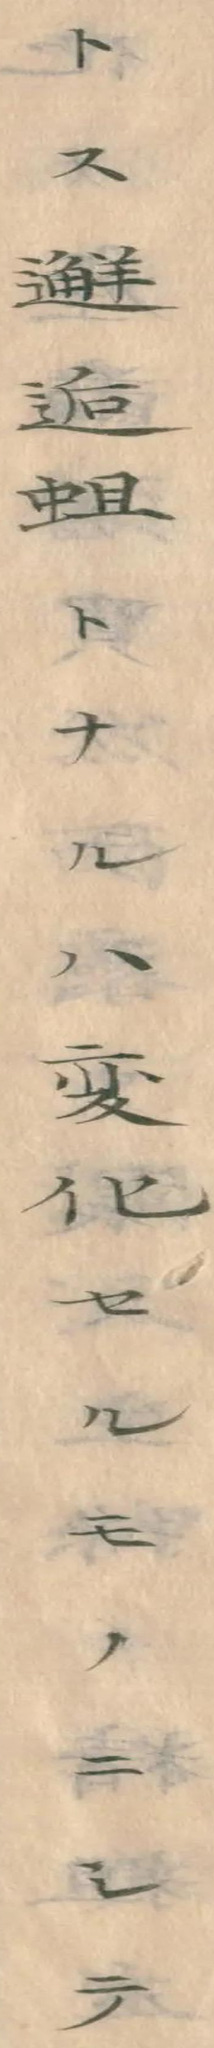トス邂逅蛆トナルハ変化セルモノニシテ
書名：蚕桑集成
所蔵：国立国会図書館 National Diet Library, JAPAN
